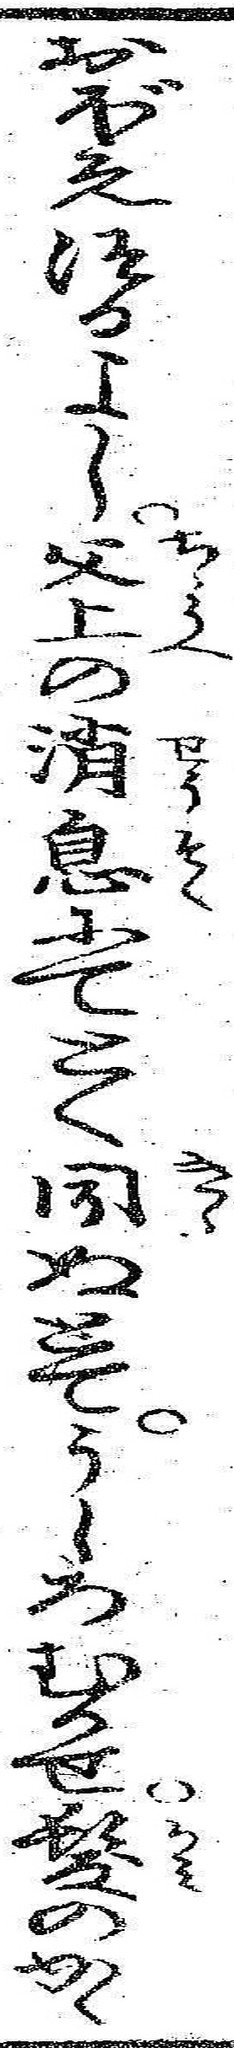おぼえつるよし。父上の消息にてとく聞ぬとて。うしろむかせ。髪のかゝ
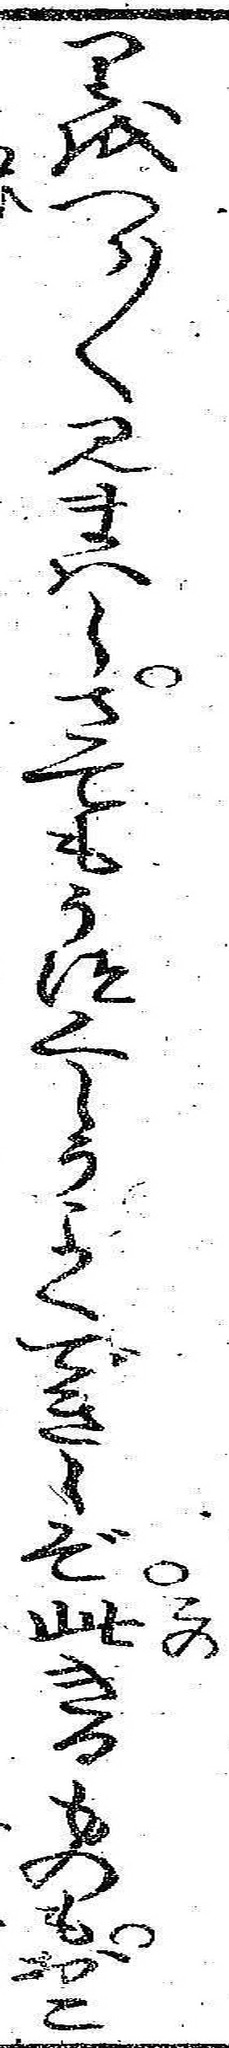りをつら〳〵見まはし。さてもうつくしうよくできしぞ。此きるものも。おこ
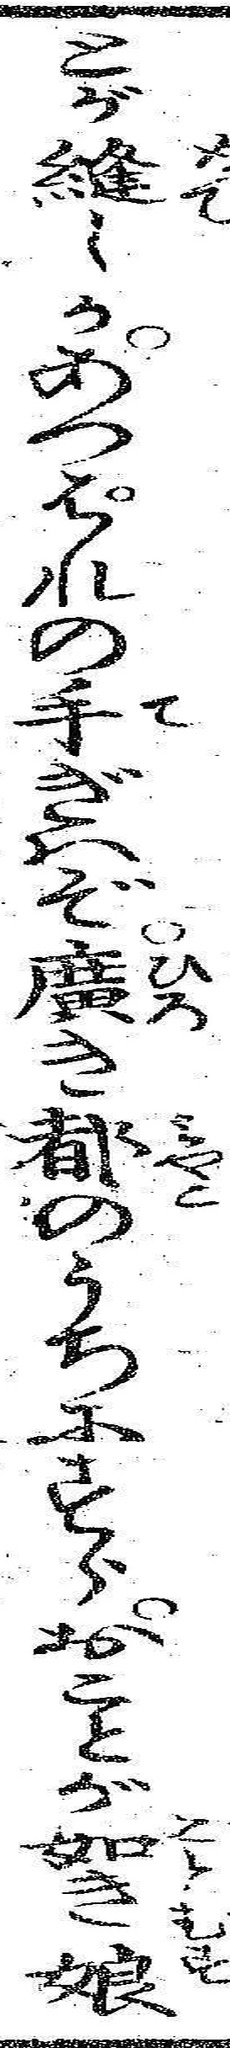とが縫しか。あつぱれの手ぎはぞ。広き都のうちにすら。おことが如き娘
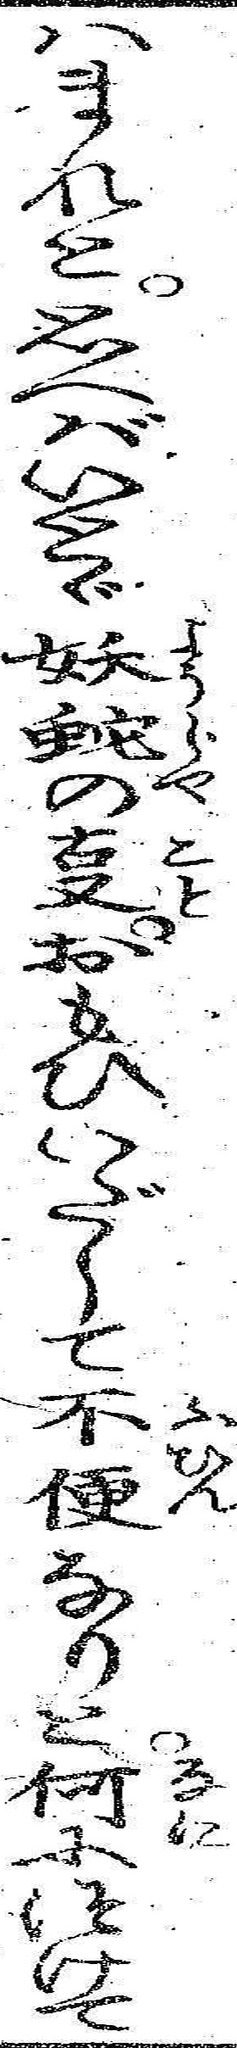はまれと。思へばいとゞ妖蛇の事。おもひいだして不便なりと。何につけて
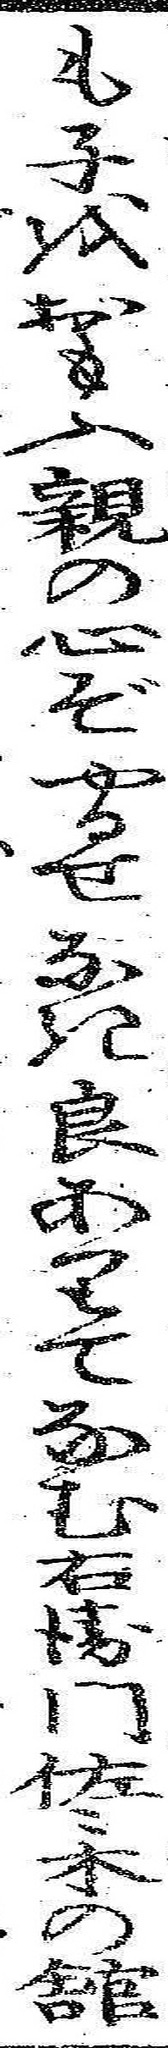も子をおもふ。親の心ぞやるせなき。良ありてなむ右衛門。佐々木の館
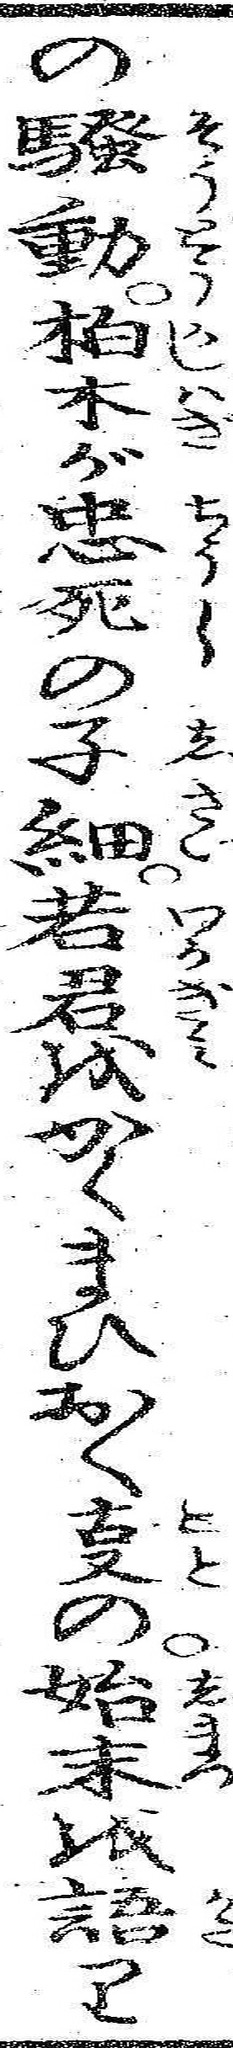の騒動。柏木が忠死の子細。若君をかくまひおく事の。始末を語り
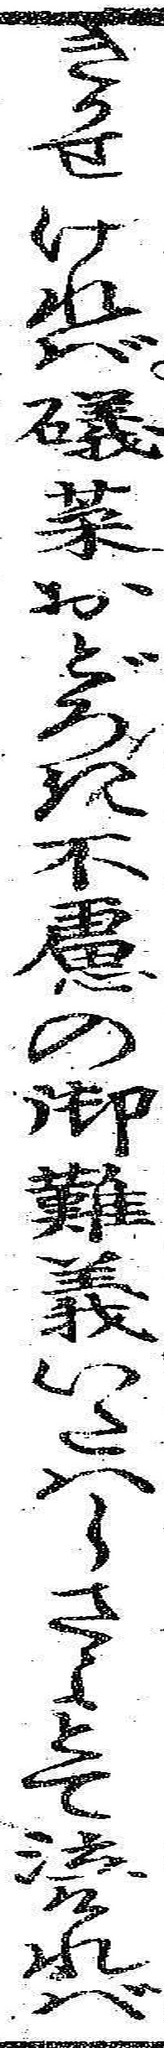きかせければ。礒菜おどろき。不慮の御難義。いたはしさよとて泣ければ。
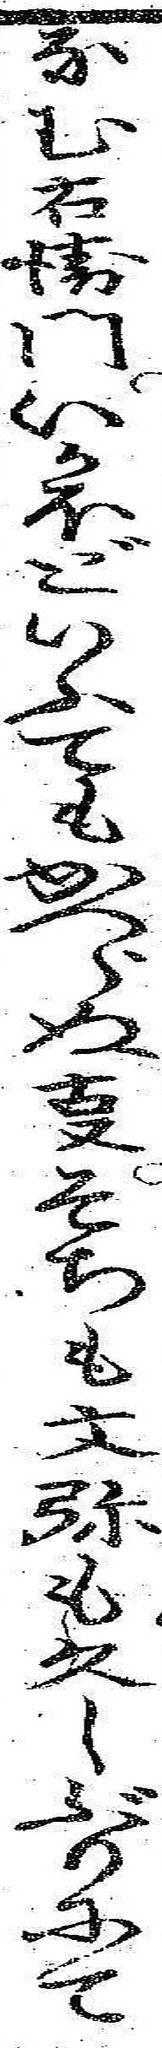なむ右衛門。いかほどいふてもかへらぬ事。そちも文弥も。久しぶりにて
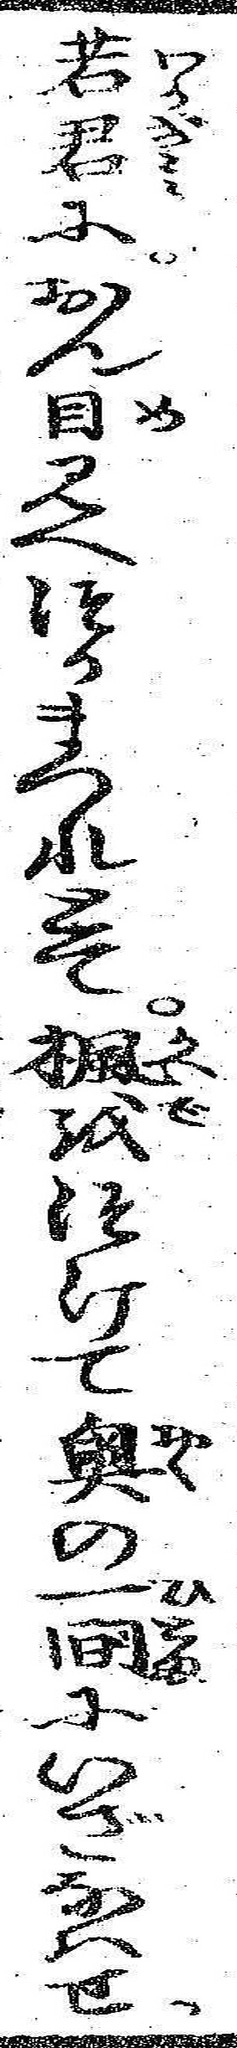若君に。おん目見へつかまつれとて。楓をつけて奥の一間にいざなはせ。
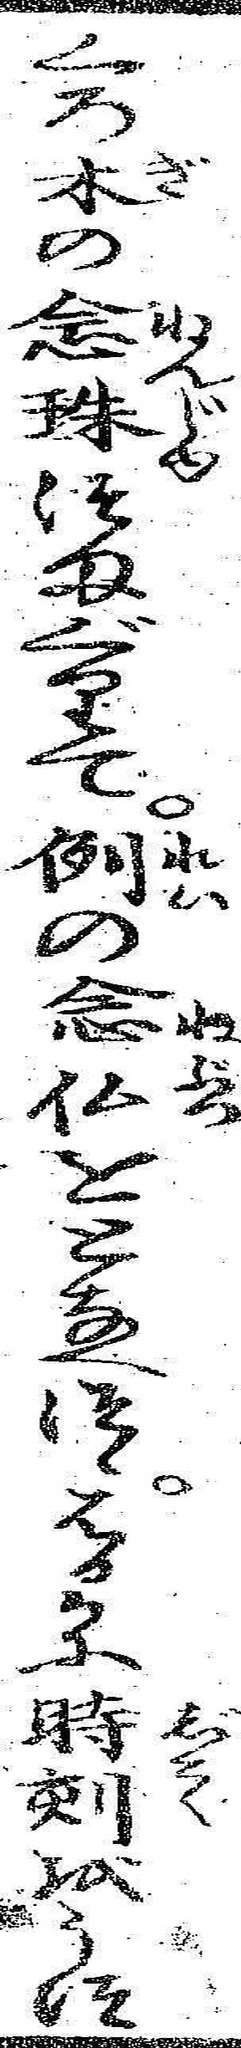くろ木の念珠つまぐりて。例の念仏をとなへつゝ。はるかに時刻をうつ
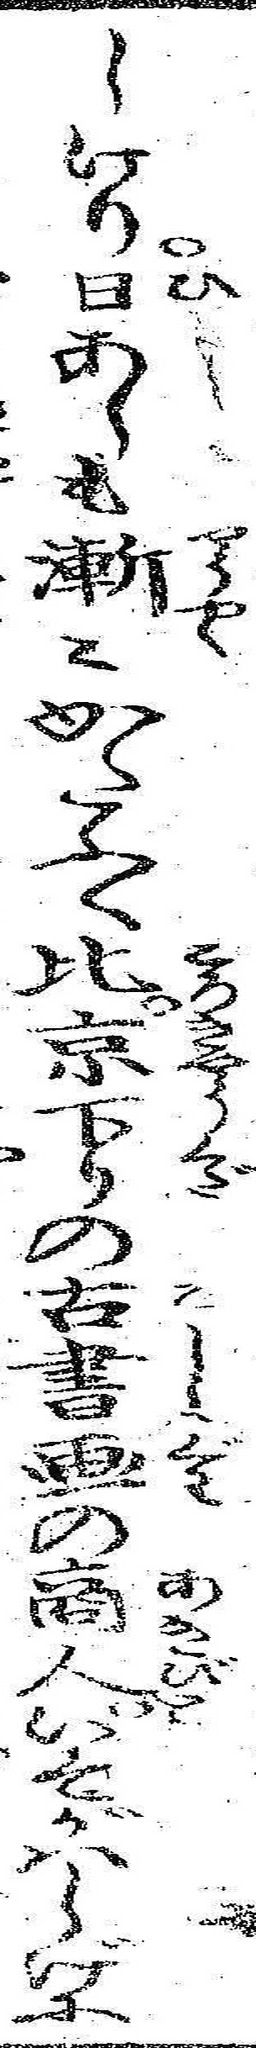しけり。日あしも漸々かたふく比。京下りの古書画の商人。いそがはしげに
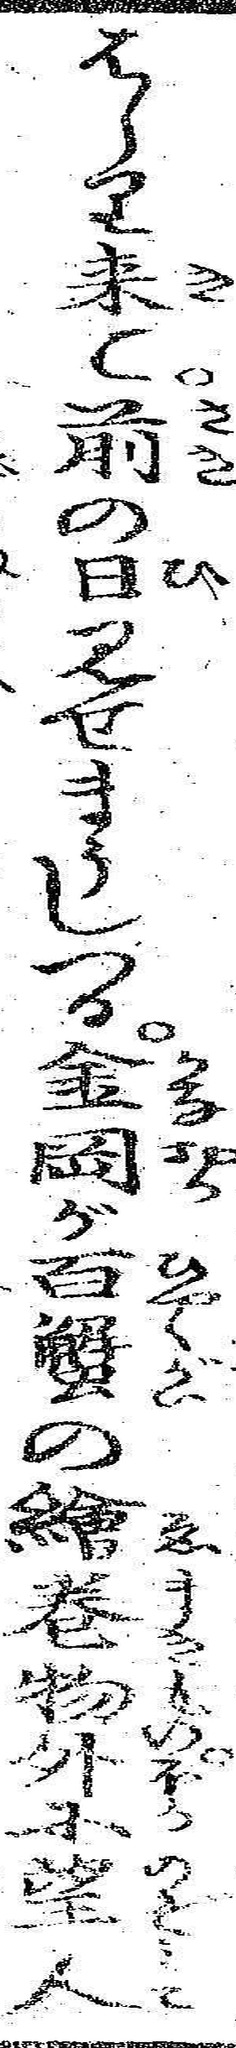はしり来て。前の日見せまうしつる。金岡が百蟹の絵巻物。外に望人
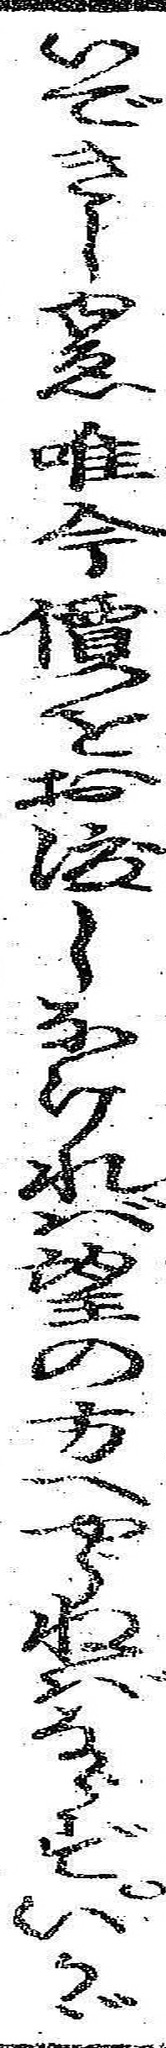いできしゆゑ。唯今価をお渡しなければ。望の方へやらねばならず。いかゞ
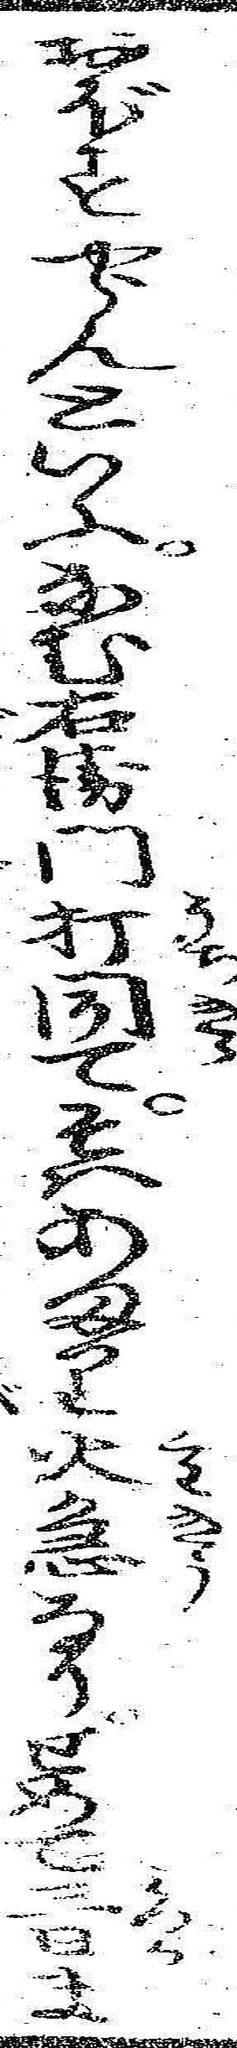おぼすやらんといふ。なむ右衛門打聞て。そはあまり火急なり。せめて三日ま
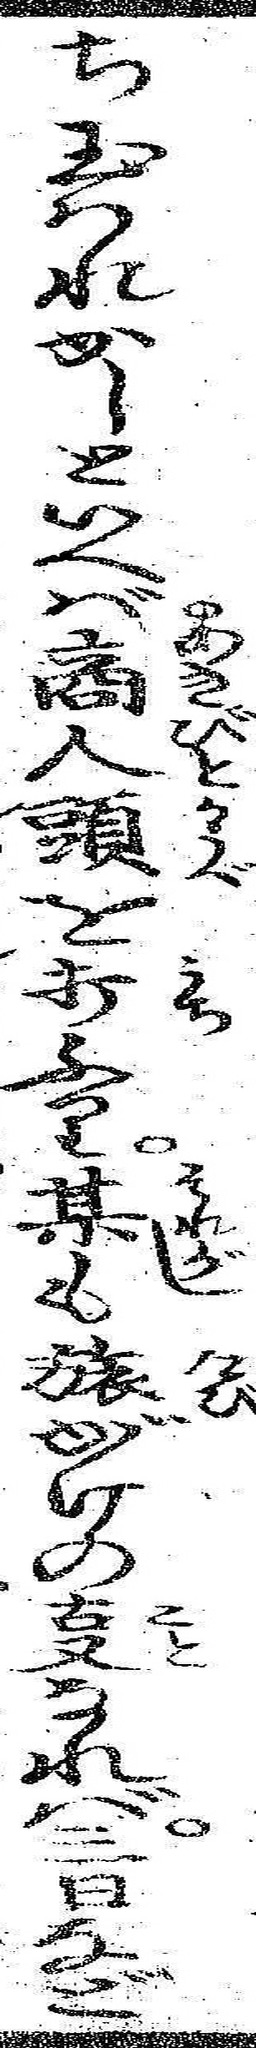ち玉はれかしといへば。商人頭を打ふり。某も旅がけの事なれば。三日など
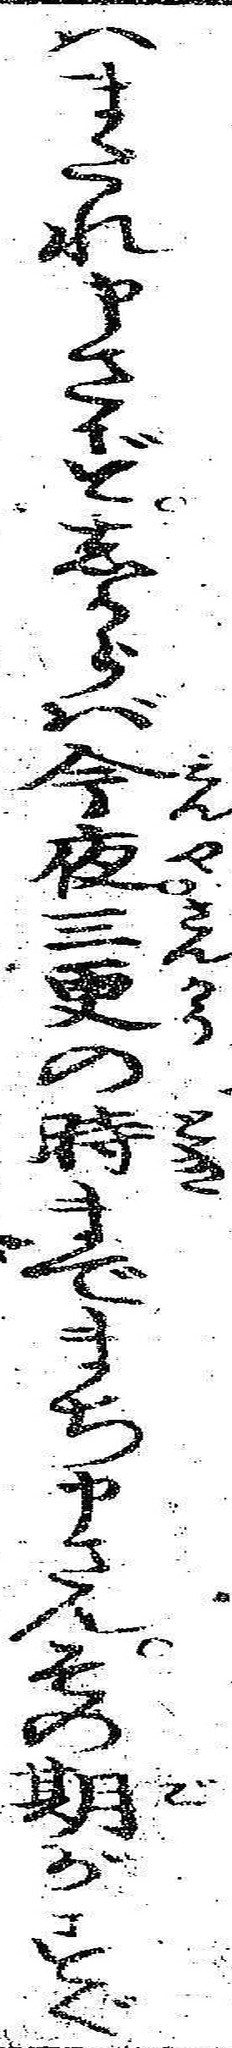はまたれ申さず。しからば今夜。三更の時までまち申さん。その期がすぐ
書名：昔話稲妻表紙
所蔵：国文学研究資料館
